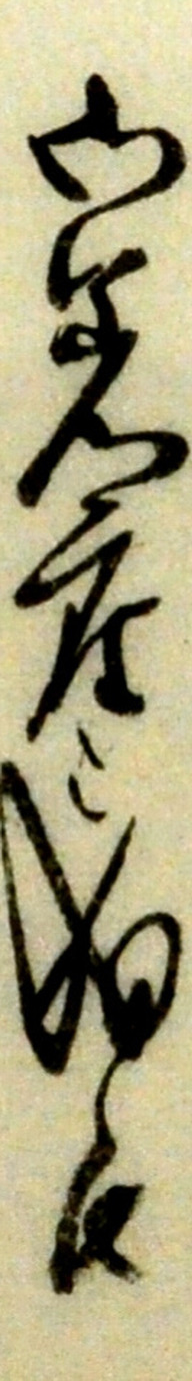御着座被成候由
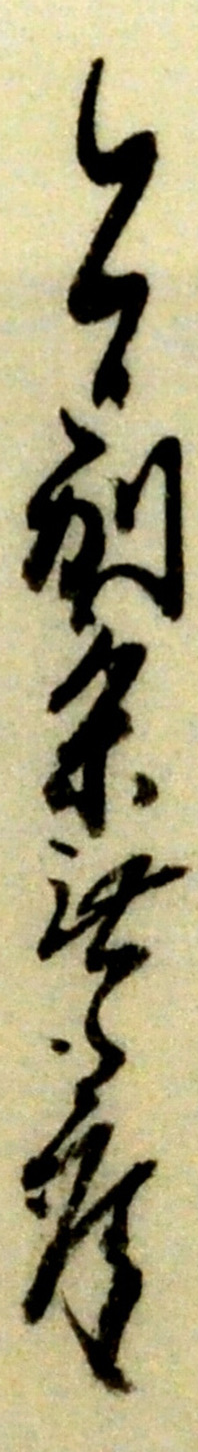今日別条無御座候

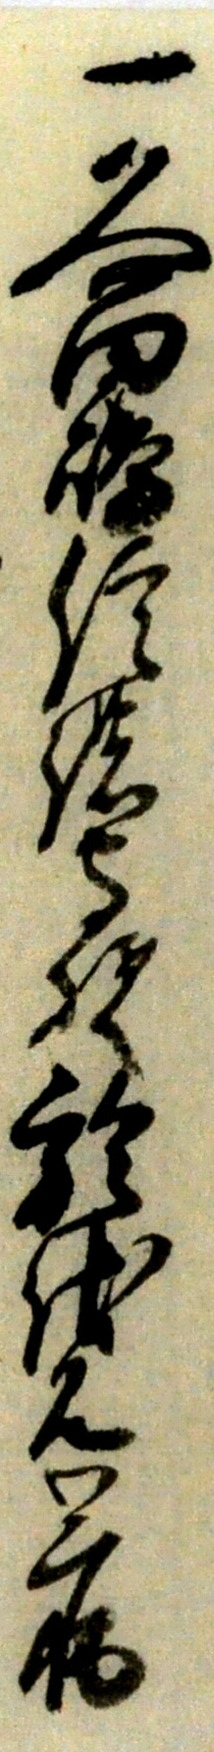一久留島信濃守様於伏見御病
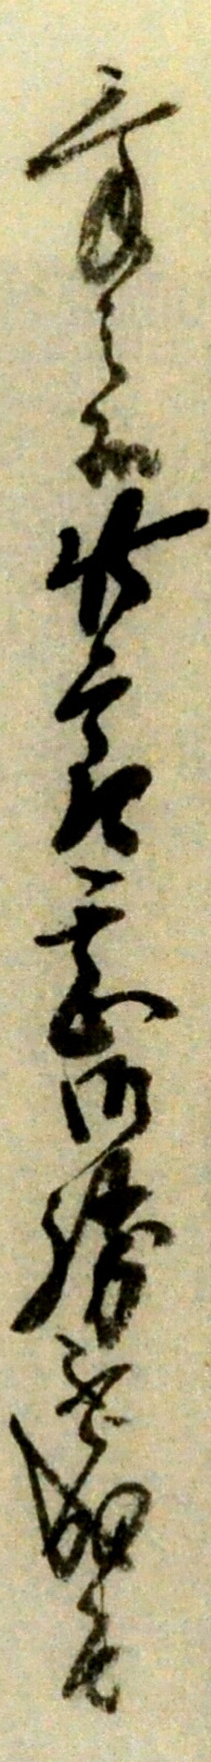気之処此節甚御勝不被成候由
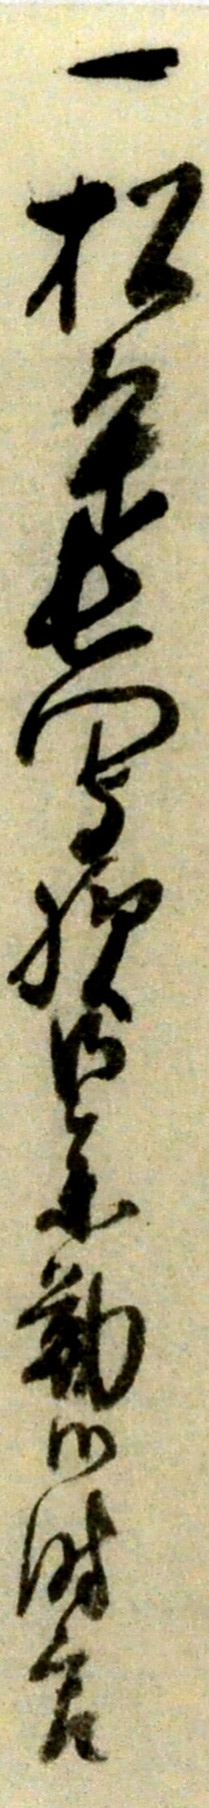一松平長門守様御参勤御時節
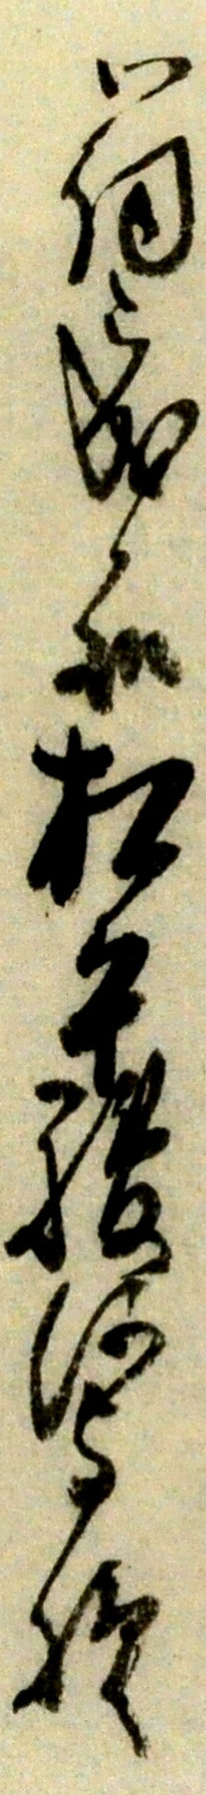御伺被成候処松平駿河守様
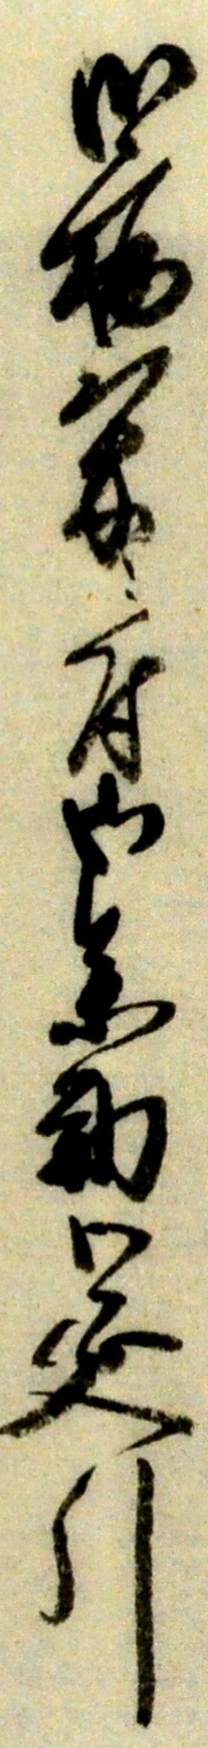御病気に付御参勤御延引
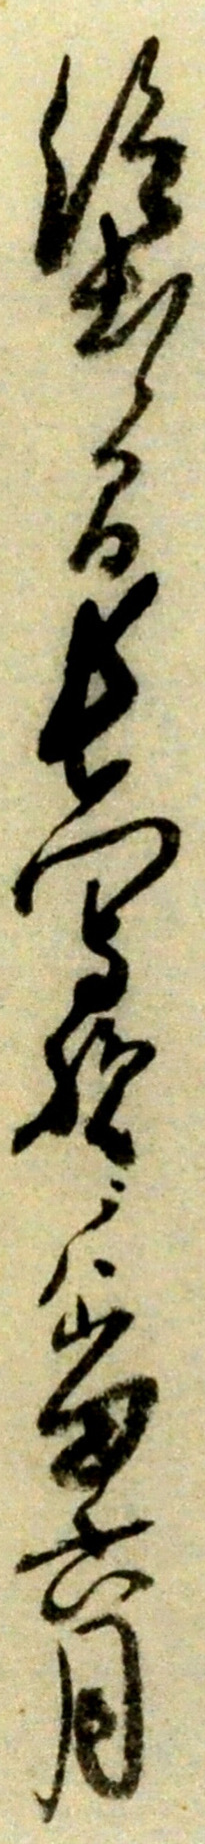仰出候間長門守様には当六月
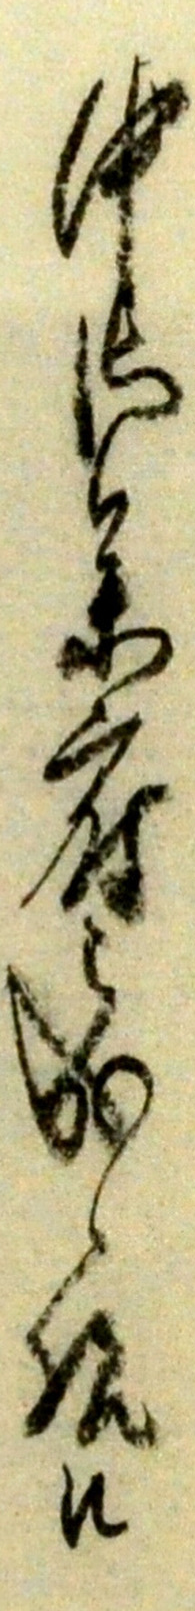中御参府被成候様被
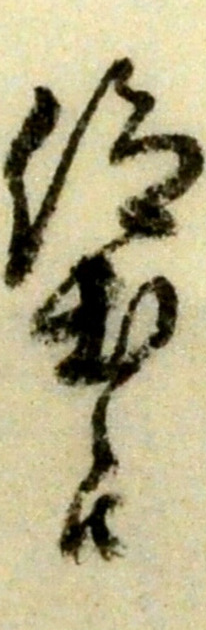仰出候
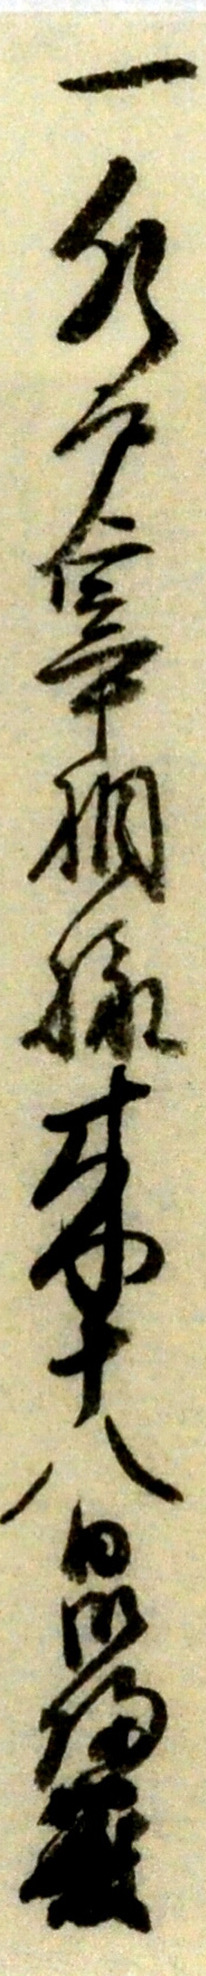一水戸宰相様来十八日御帰
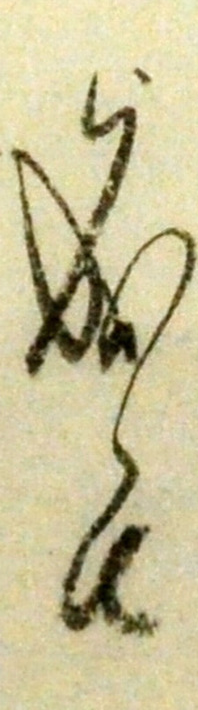被成候由
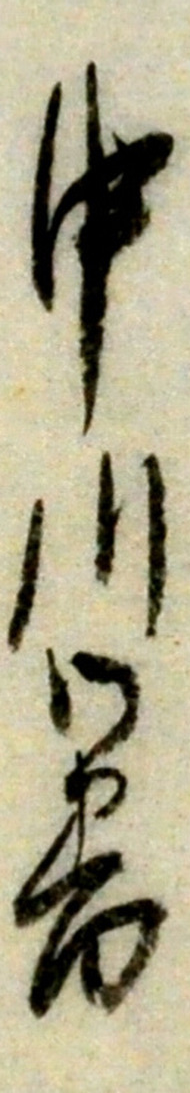中川御番
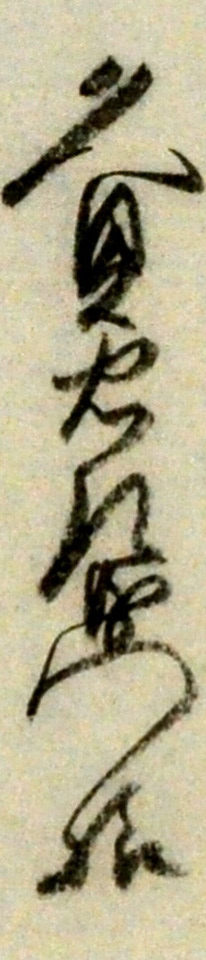久貝忠左衛門様

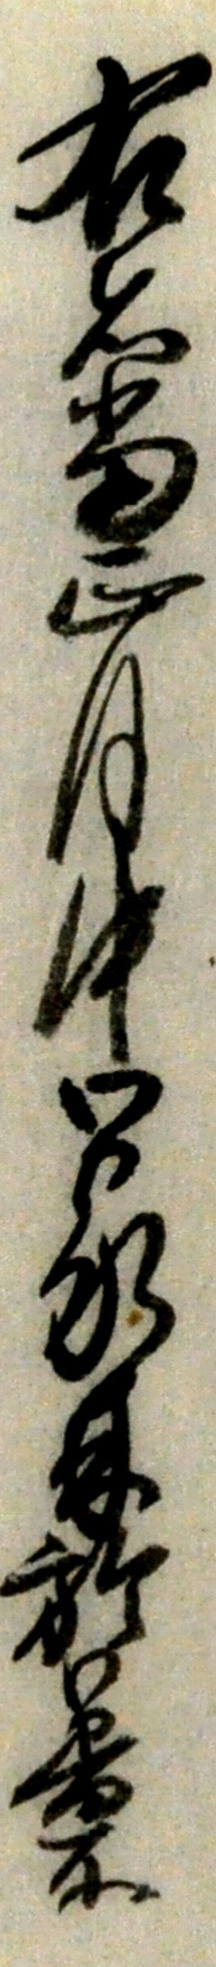右者当正月中御家来於御番所
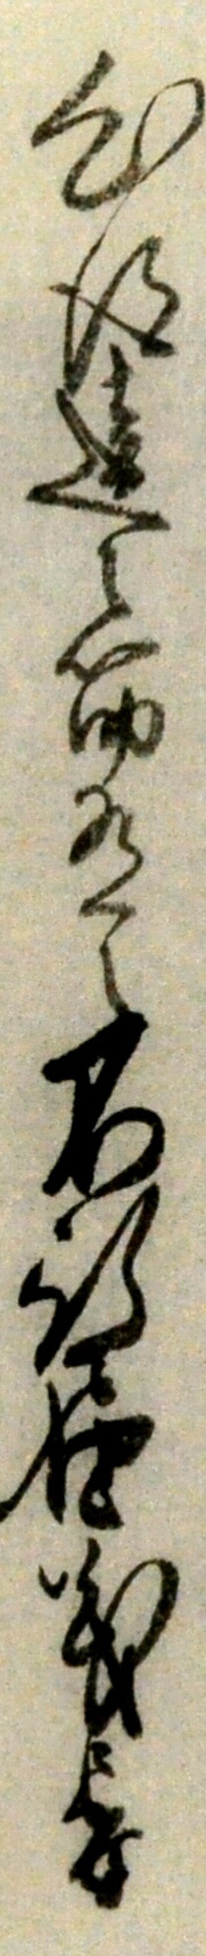心得違之筋有之不行届義に付
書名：申合帳〔一括〕
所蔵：伊那市立高遠町図書館・合同会社AMANE
